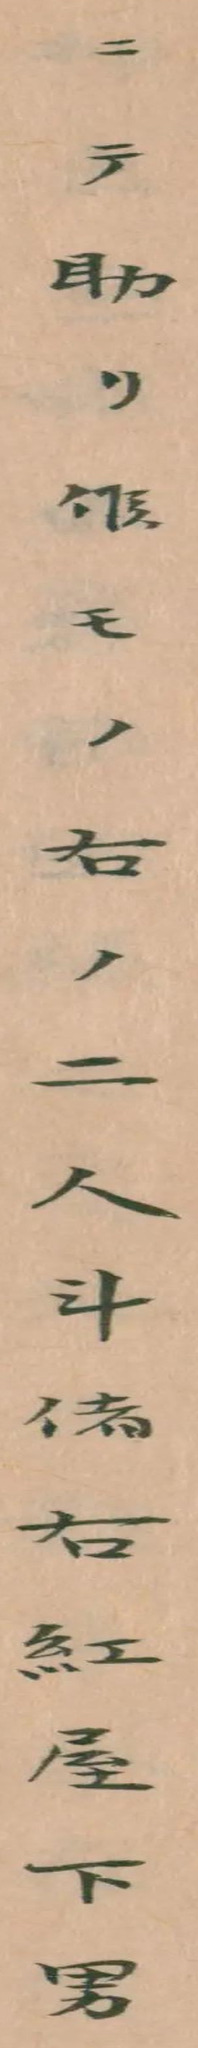ニテ助り候モノ右ノ二人斗扨右紅屋下男
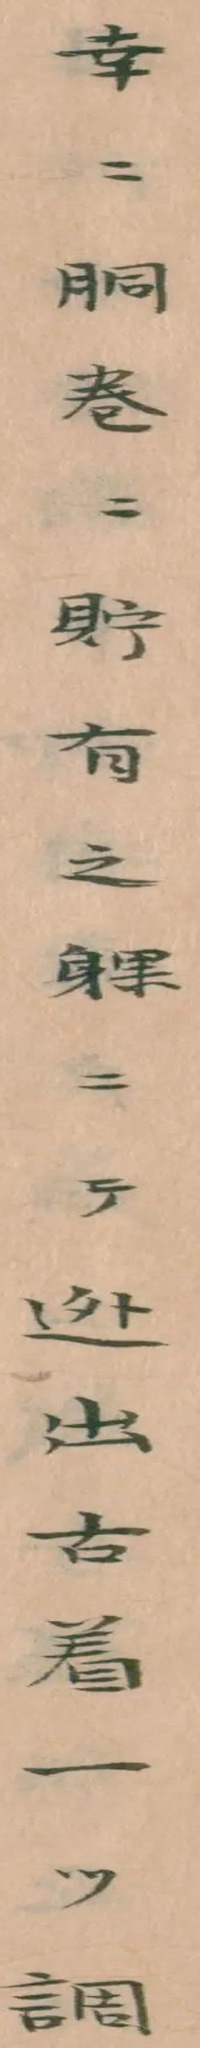幸二胴巻二貯有之裸ニテ逃出古着一ッ調
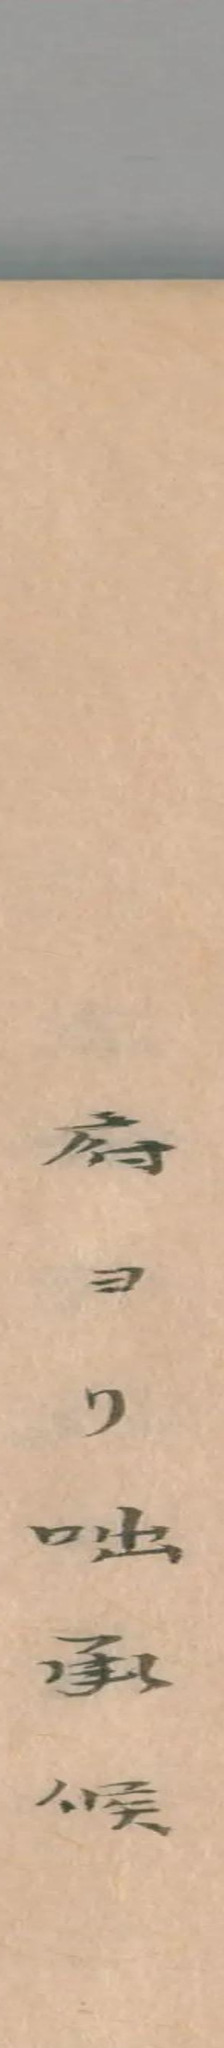府ヨリ咄承候
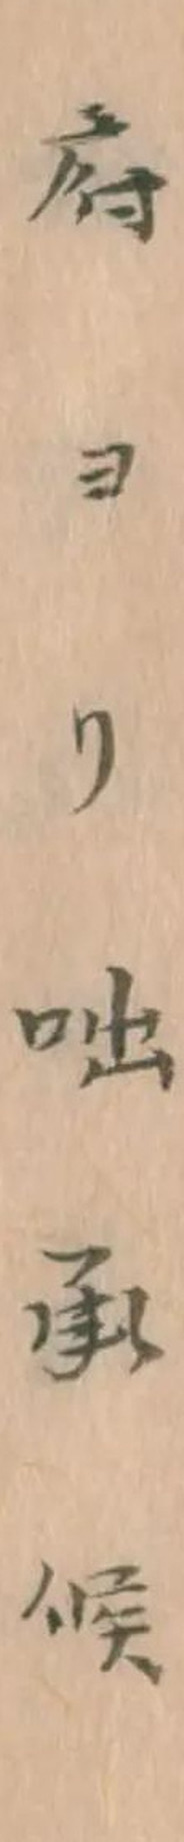府ヨリ咄承候
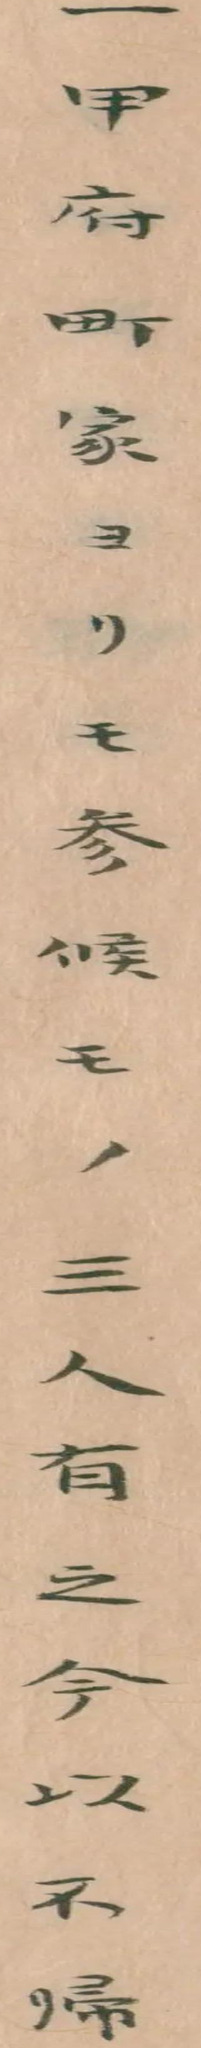一甲府町家ヨリモ参候モノ三人有之今以不帰
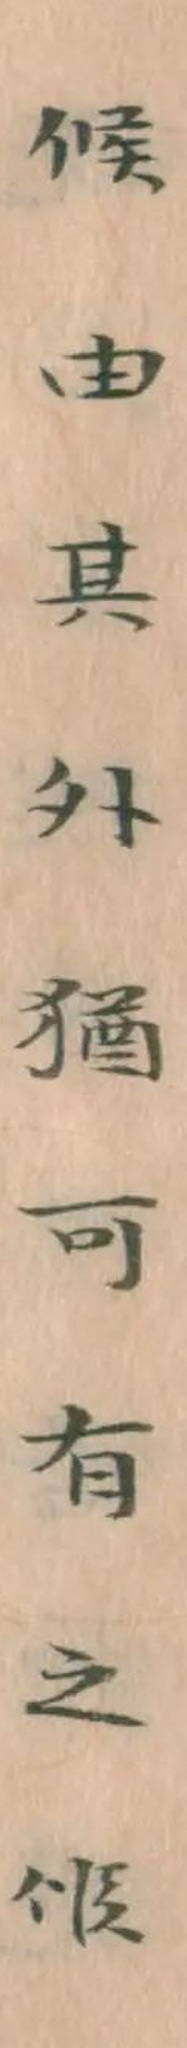候由其外猶可有之候
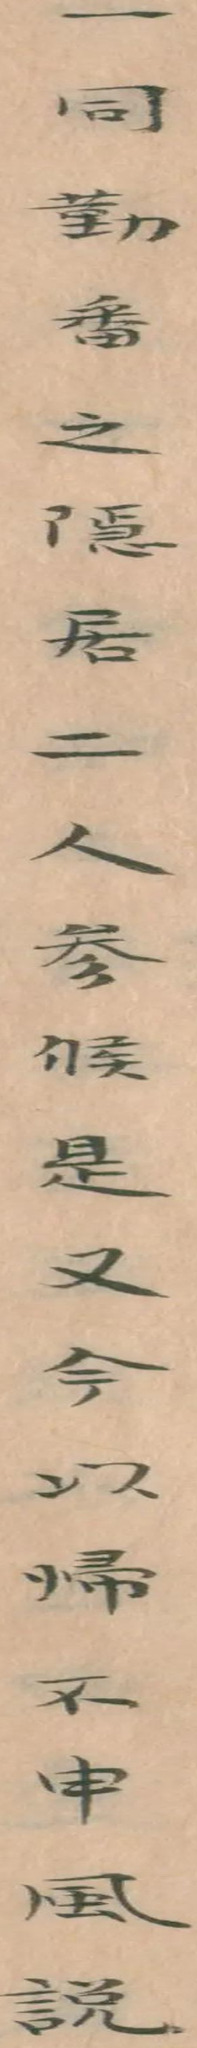一同勤番之隠居二人参候是又今以帰不申風説

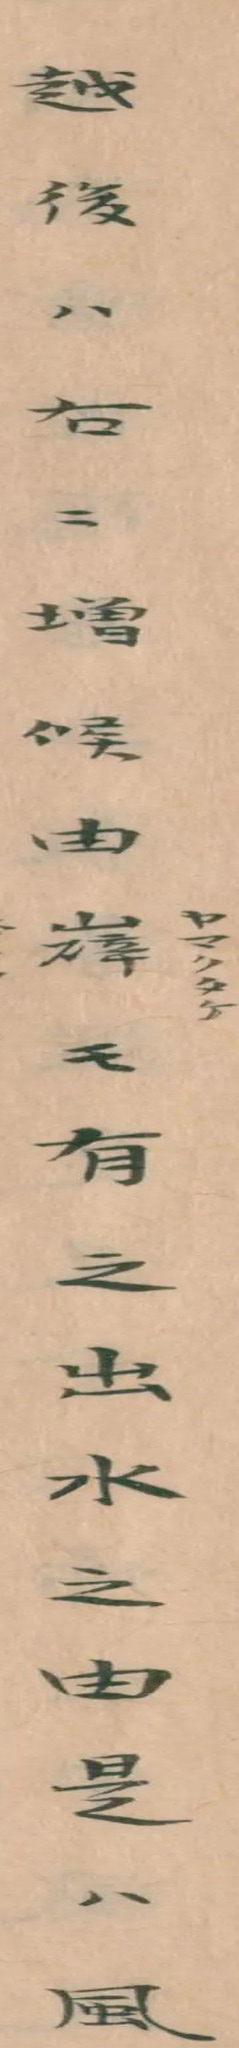一越後ハ右二増候由山砕モ有之出水之由是ハ風
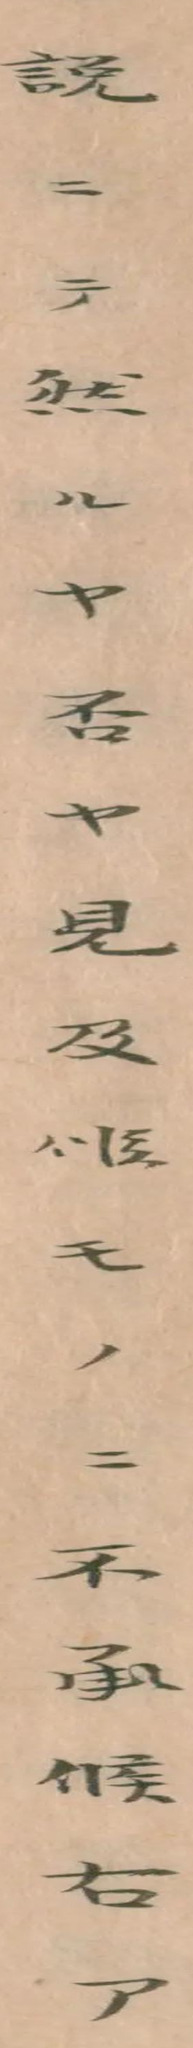説ニテ然ルヤ否ヤ見及候モノニ不承候右ア
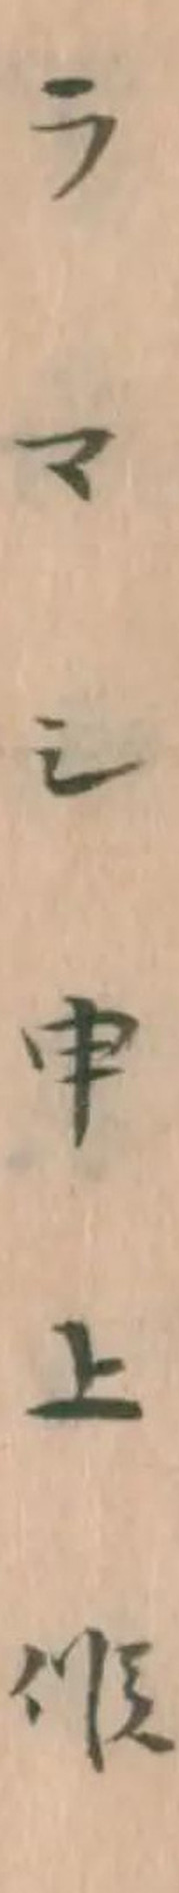ラマシ申上候
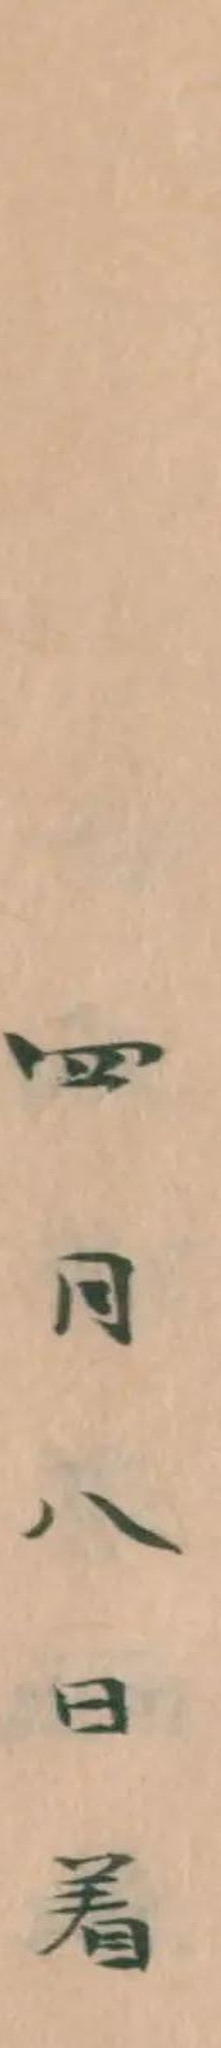四月八日着
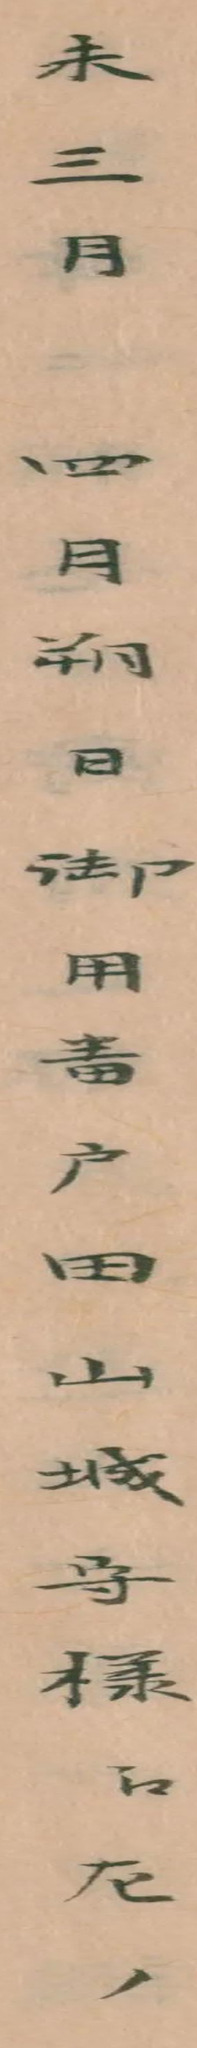未三月四月朔日御用番戸田山城守様江左ノ
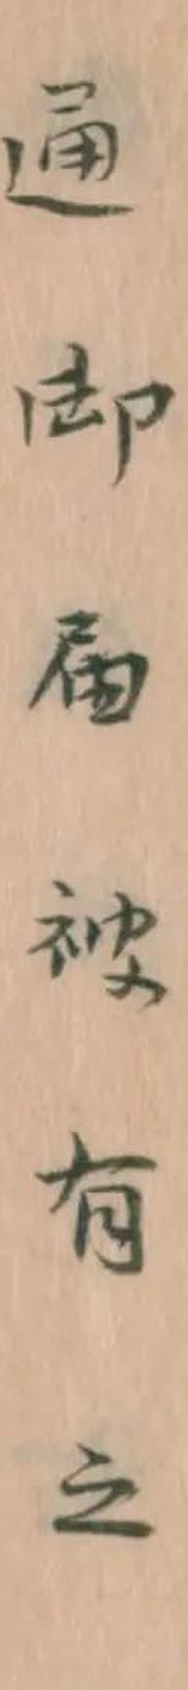通御届被有之
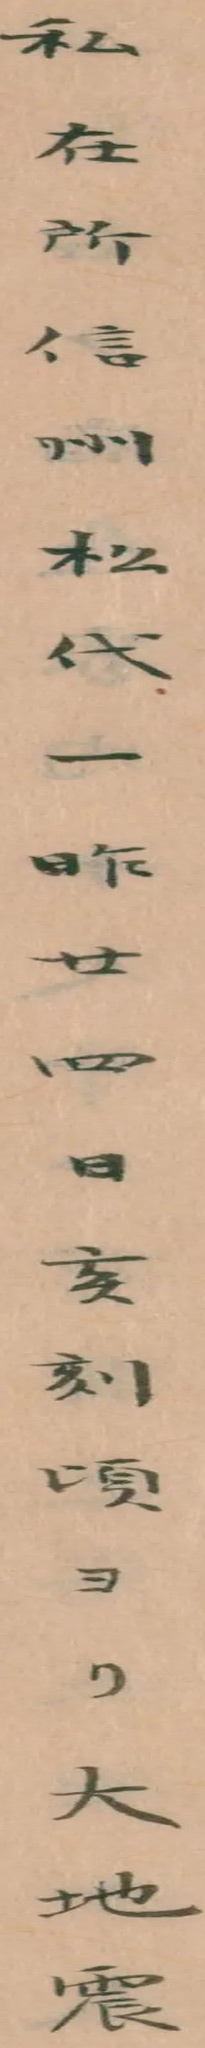私在所信州松代一昨廿四日亥刻頃ヨリ大地震
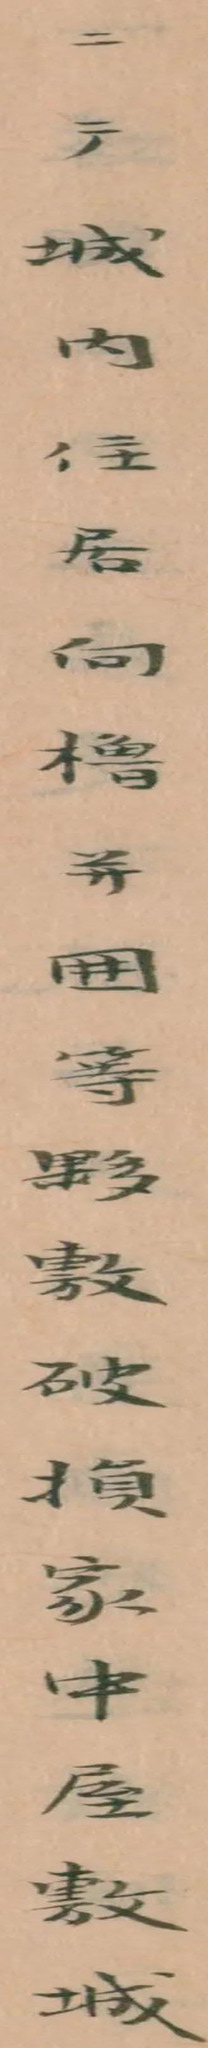ニテ城内住居向櫓并囲等夥敷破損家中屋敷城
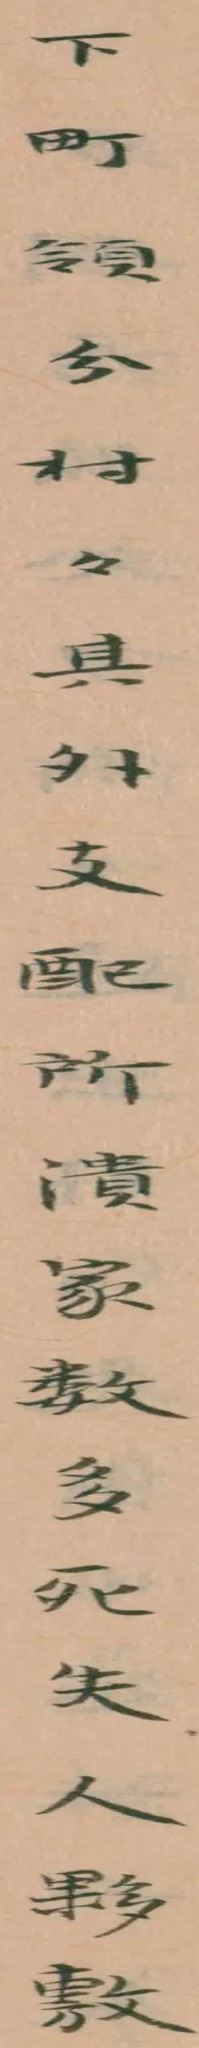下町領分村々其外支配所潰家数多死失人夥敷
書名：地災撮要. 巻1(噴火山・地震ノ部)
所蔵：国立国会図書館 National Diet Library, JAPAN
